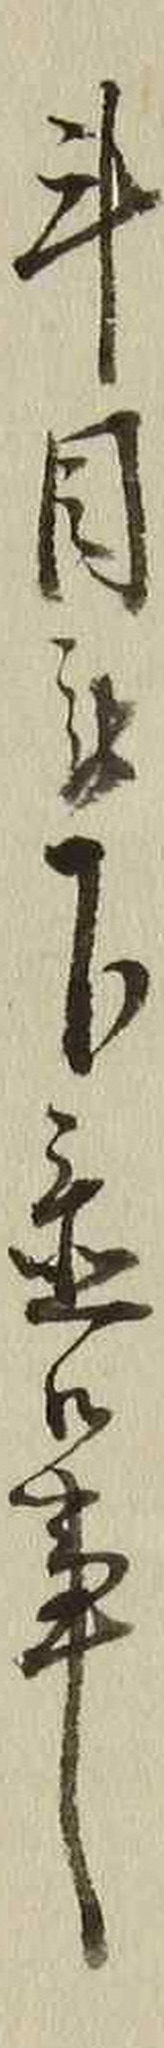斗目被下置候事
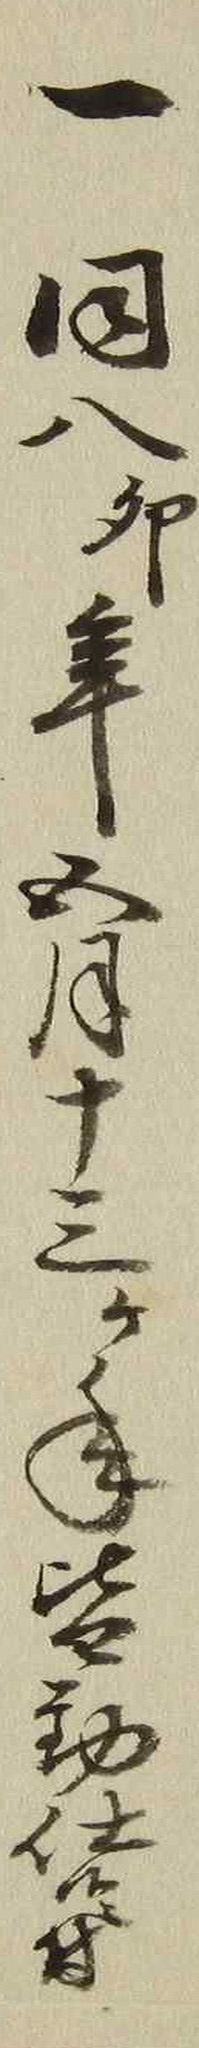一同八卯年五月十三ケ年皆勤仕候ニ付
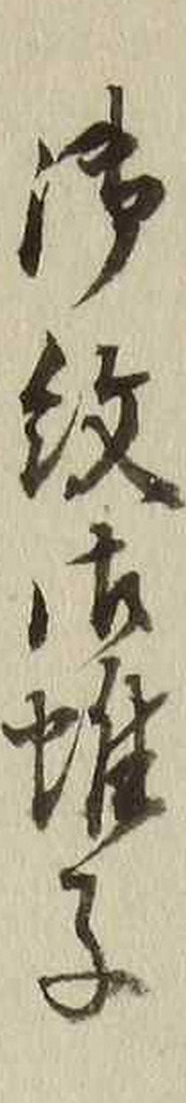御紋御帷子
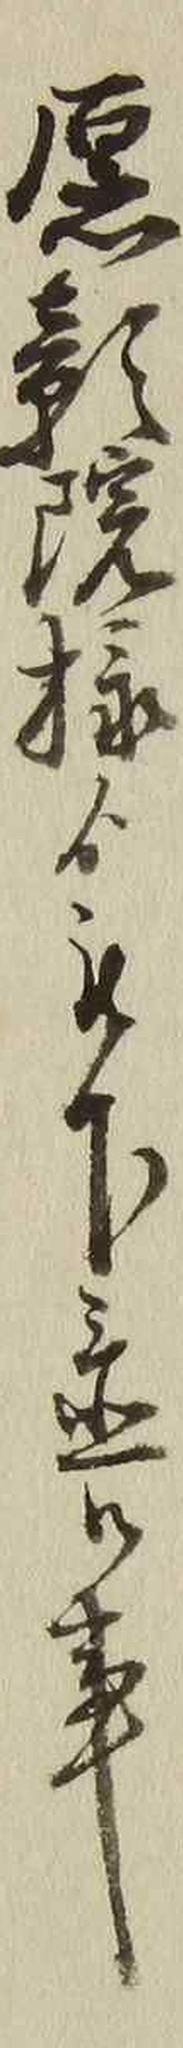愿彰院様ゟ被下置候事
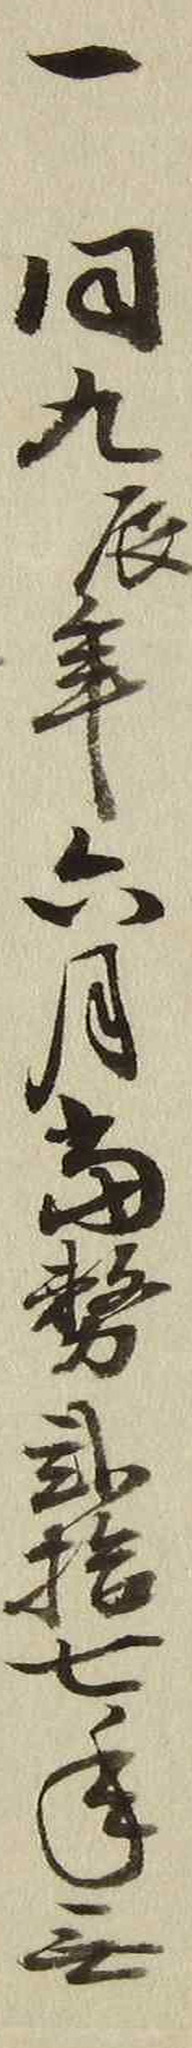一同九辰年六月当務弐拾七年無
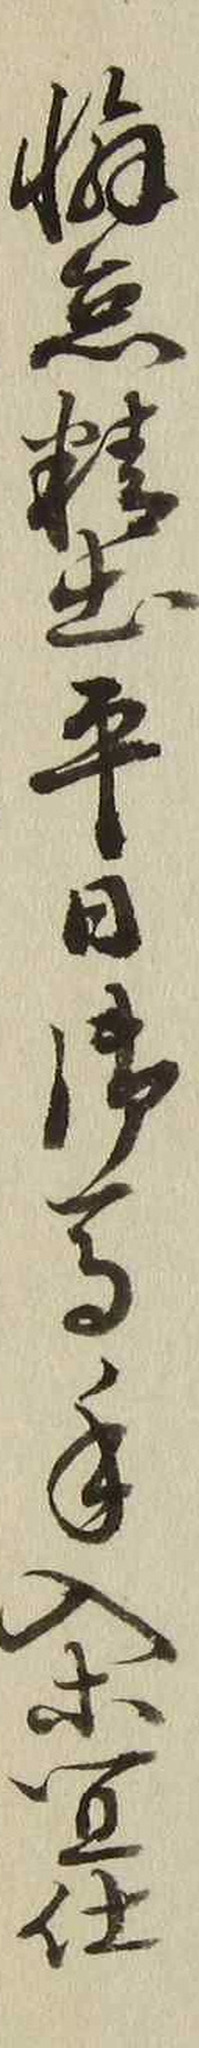懈怠精出平日御馬手入等宜仕
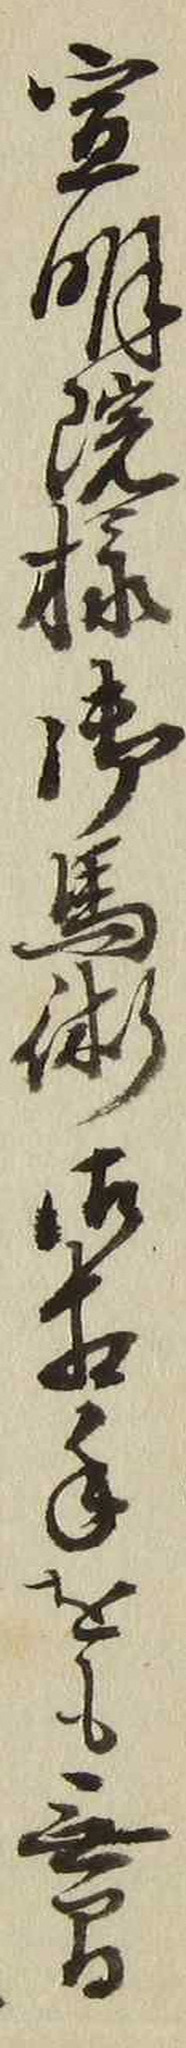宣明院様御馬術御相手をも無間
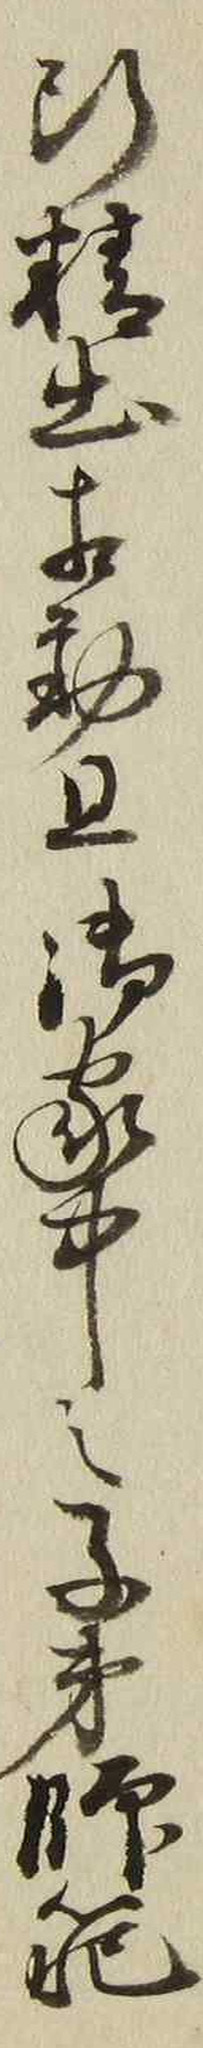断精出相勤且御家中之子弟師範
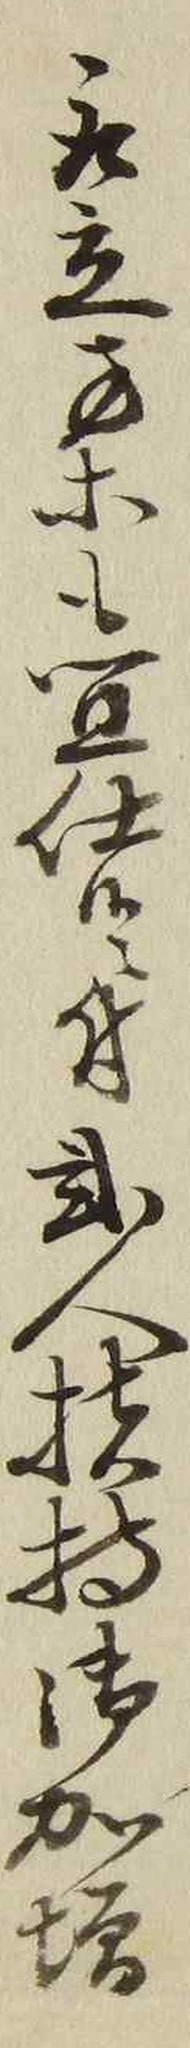取立方等も宜仕候ニ付弐人扶持御加増
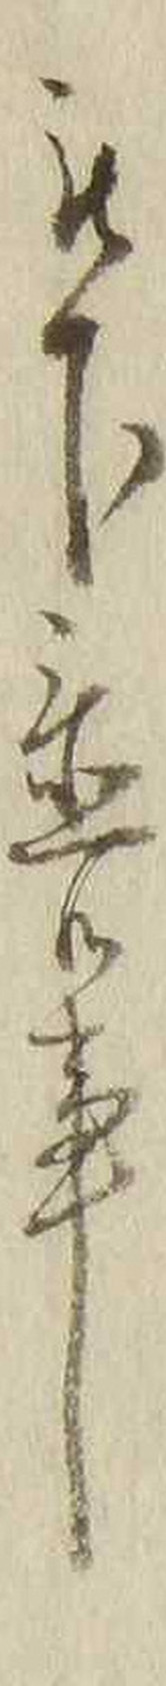被下置候事

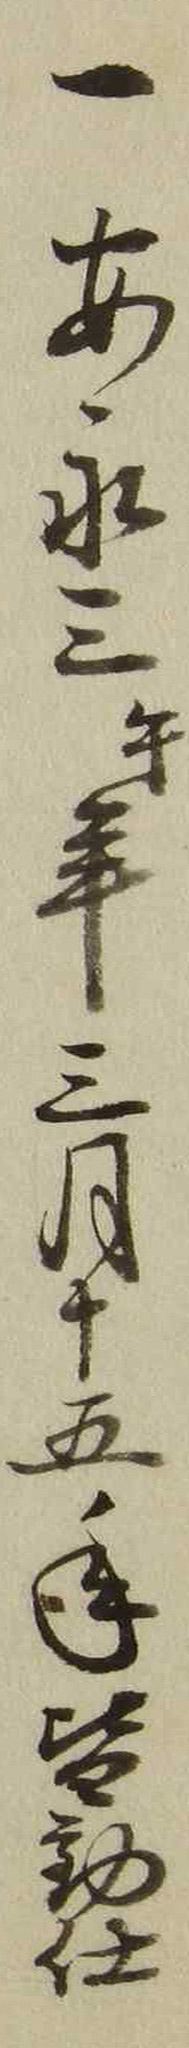一安永三午年三月十五年皆勤仕
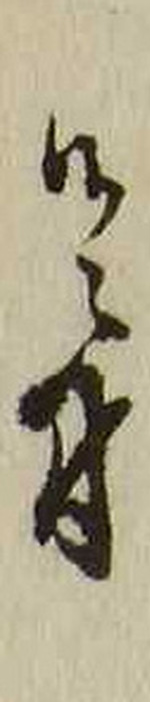候ニ付
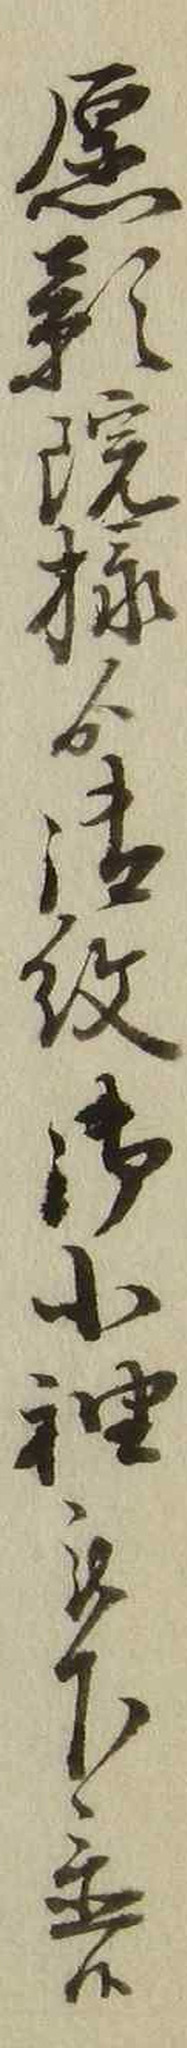愿彰院様ゟ御紋御小袖被下置候
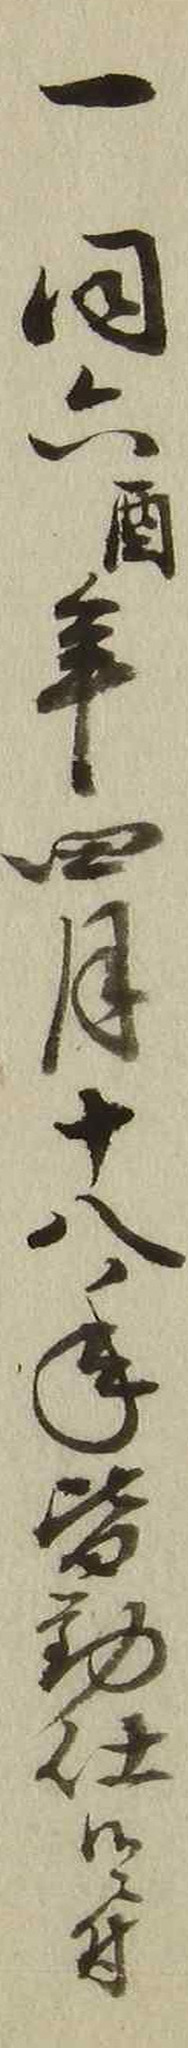一同六酉年四月十八年皆勤仕候ニ付
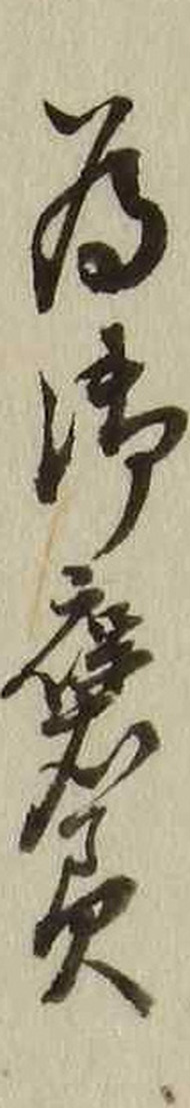為御褒美
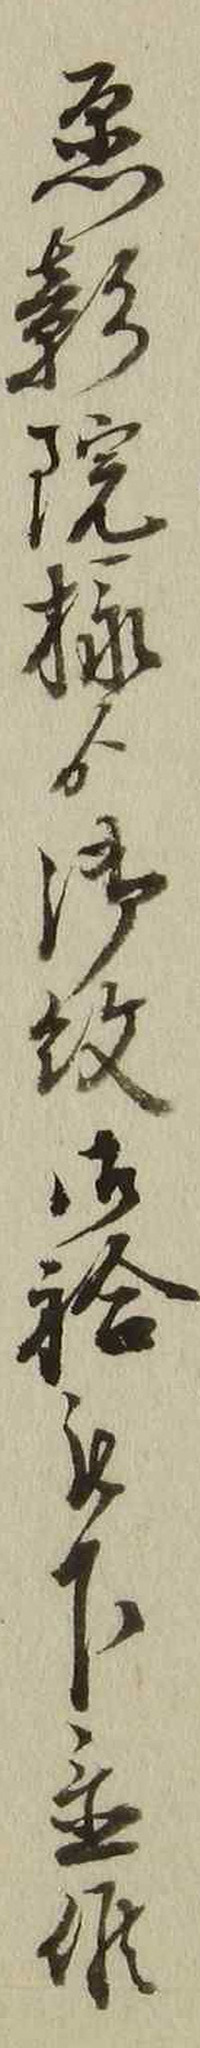愿彰院様ゟ御紋御袷被下置候
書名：諸士系譜　巻之31　い之部31
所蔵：会津若松市立会津図書館
